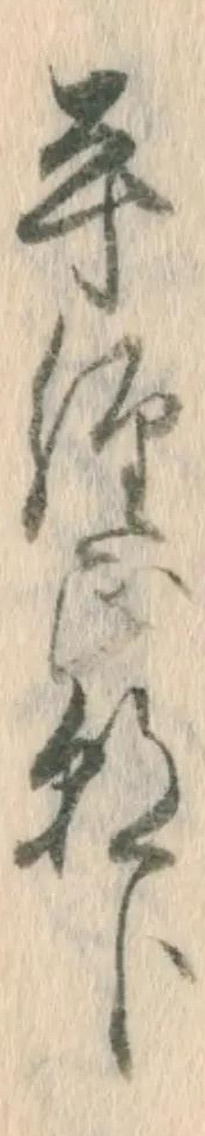平経正朝臣
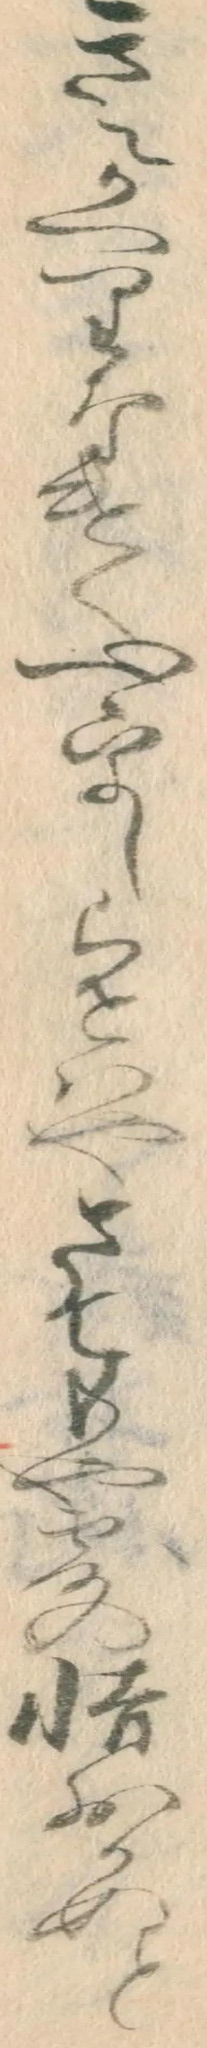きえかへりなけく心をしらせはやさてもや露の情おかぬと

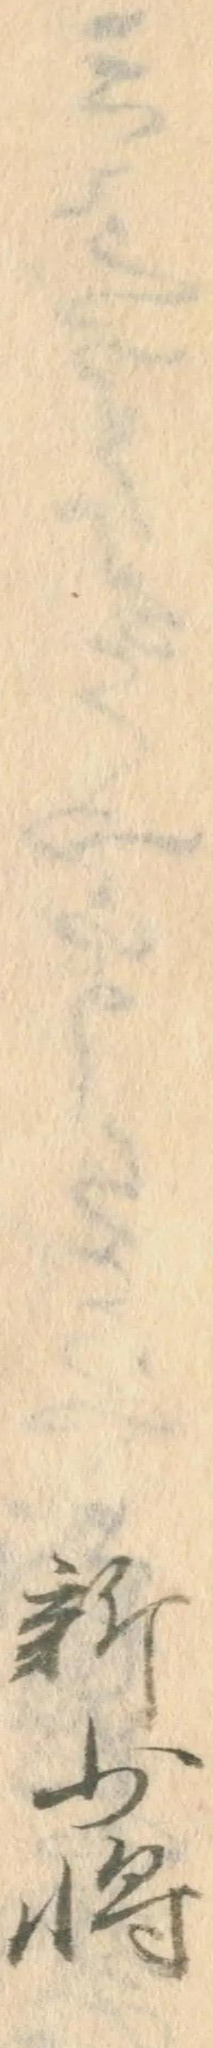新少将
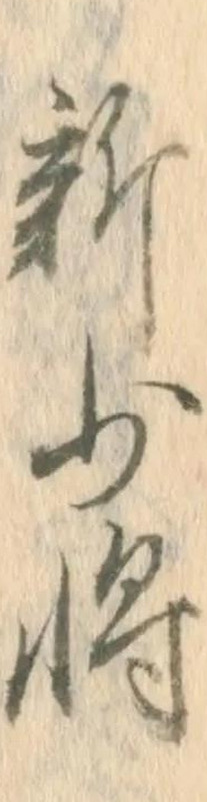新少将
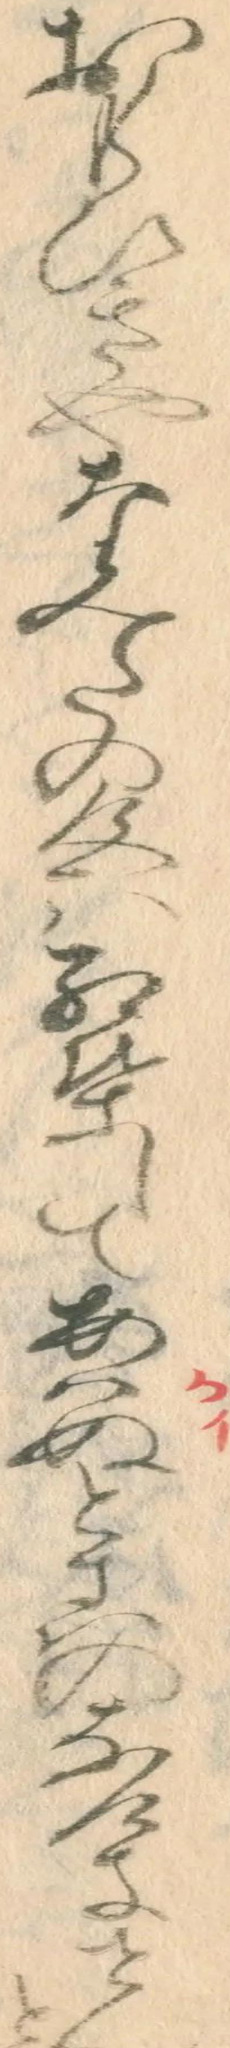おもひきやなみたの色は紅葉してあはぬときはのなけせんとは
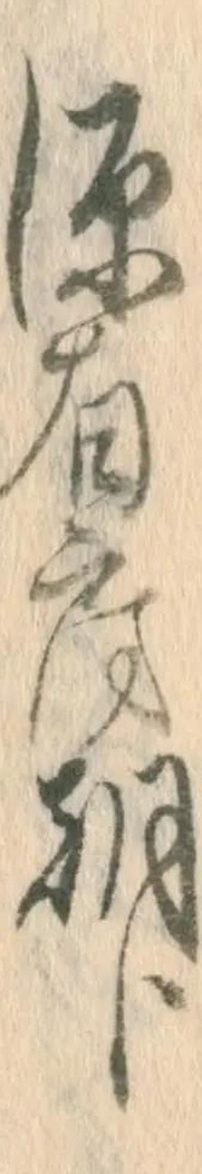源有房朝臣
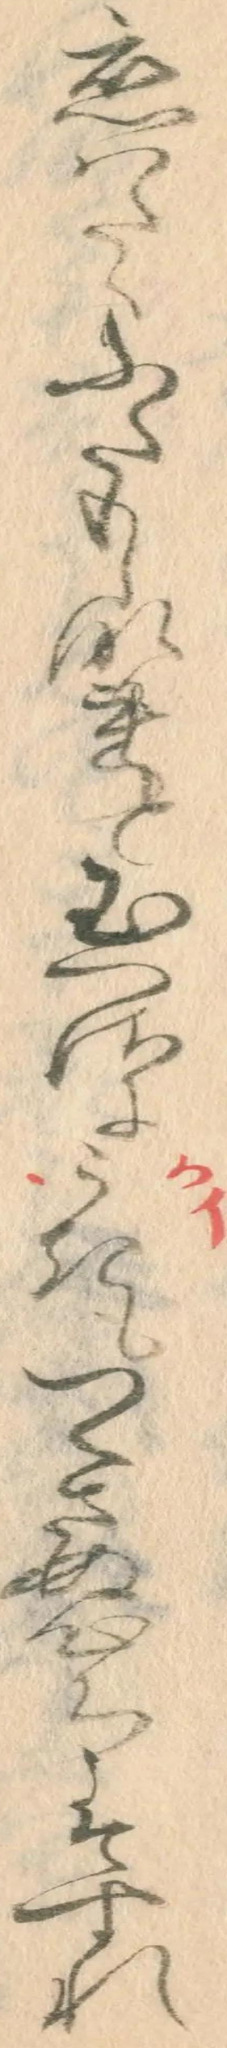恋はたゝふたもしなれと玉つさにうきもつくさぬ心ちこそすれ
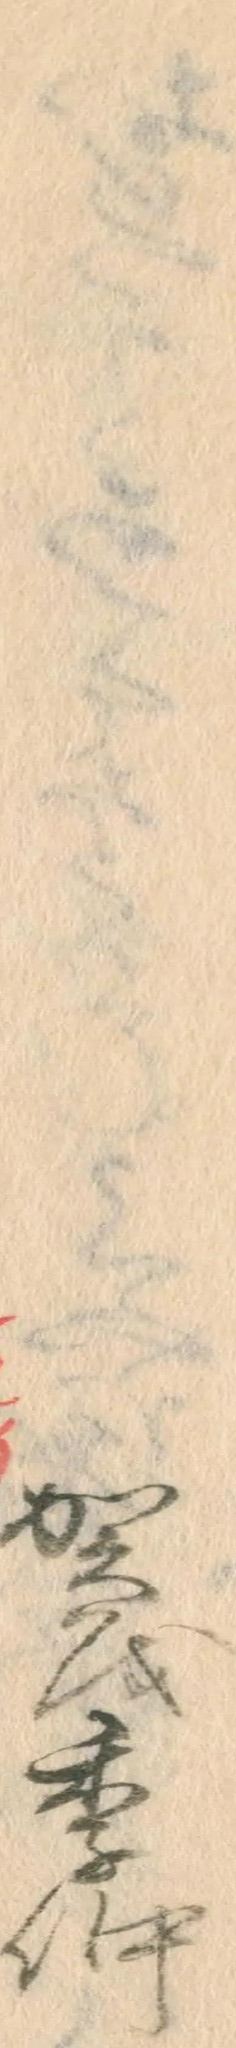賀茂季仲
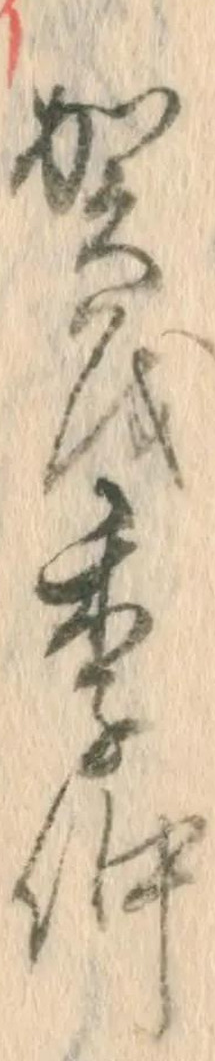賀茂季仲
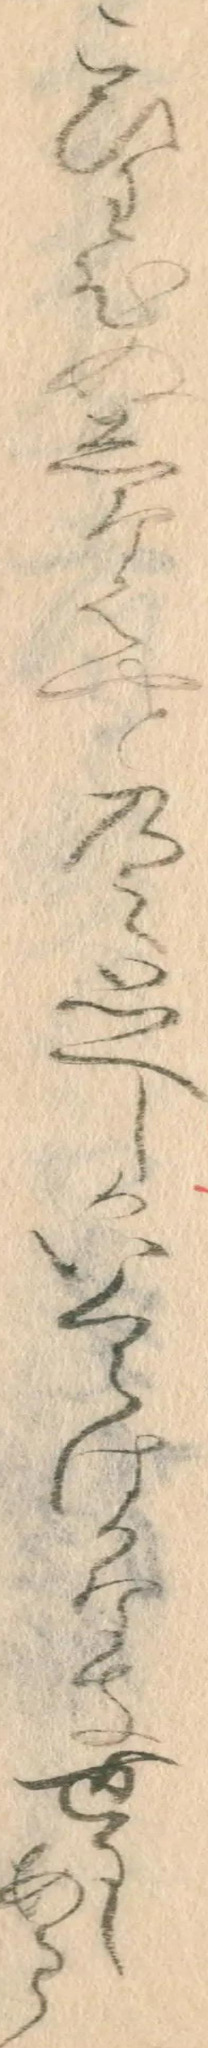こひわひぬしなはやとのみ思へしかいくらはかなき世にしあるらん
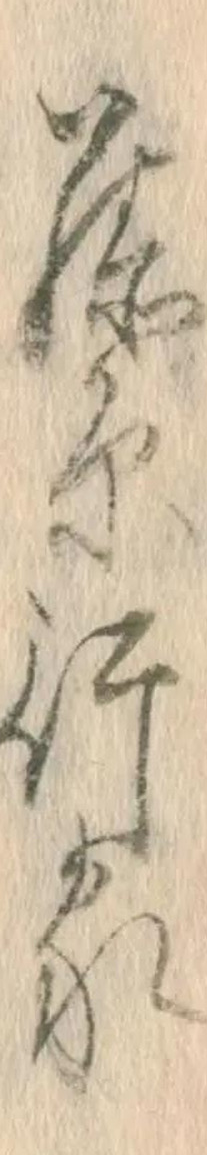藤原行家
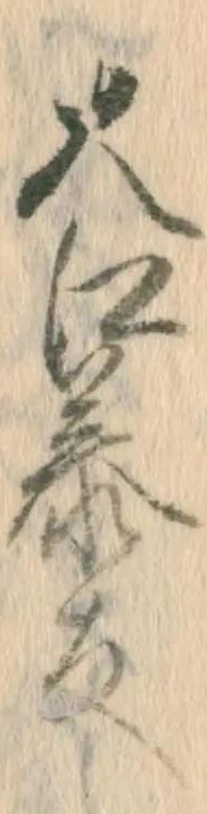大江泰友
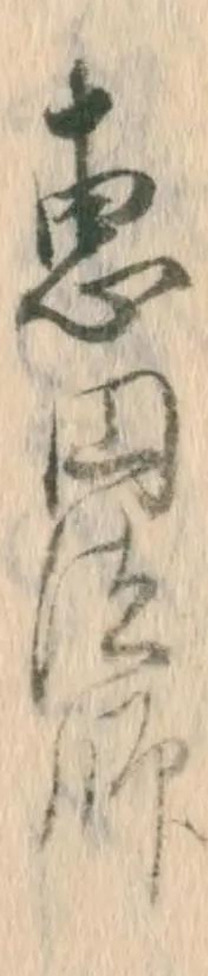恵円法師
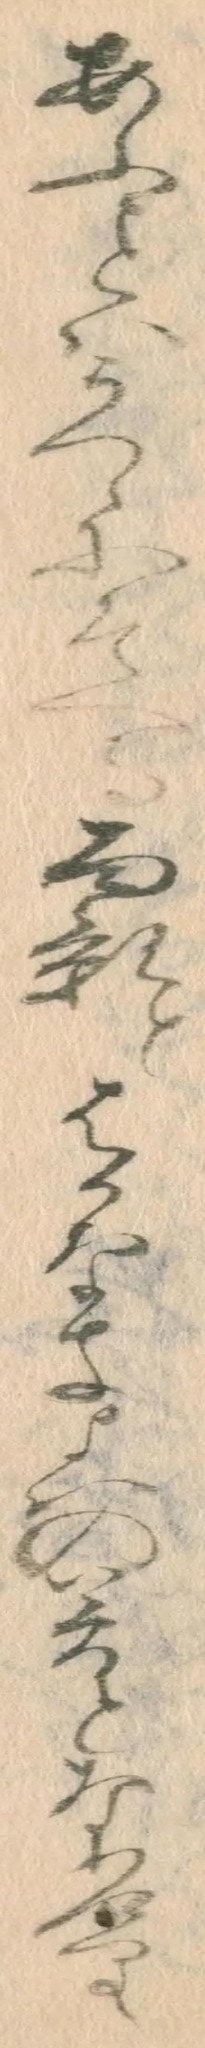あふことはうつゝにそへる面影とはかなきよはの夢となりけり
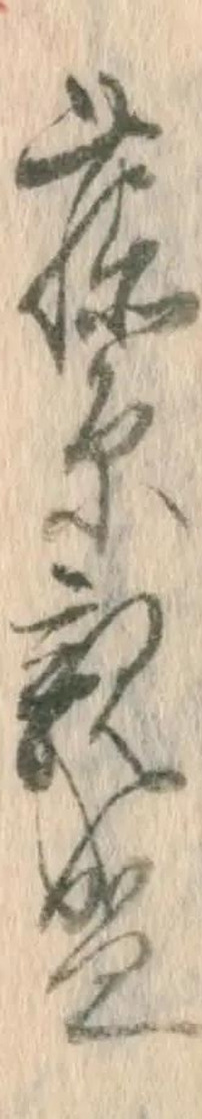藤原親盛
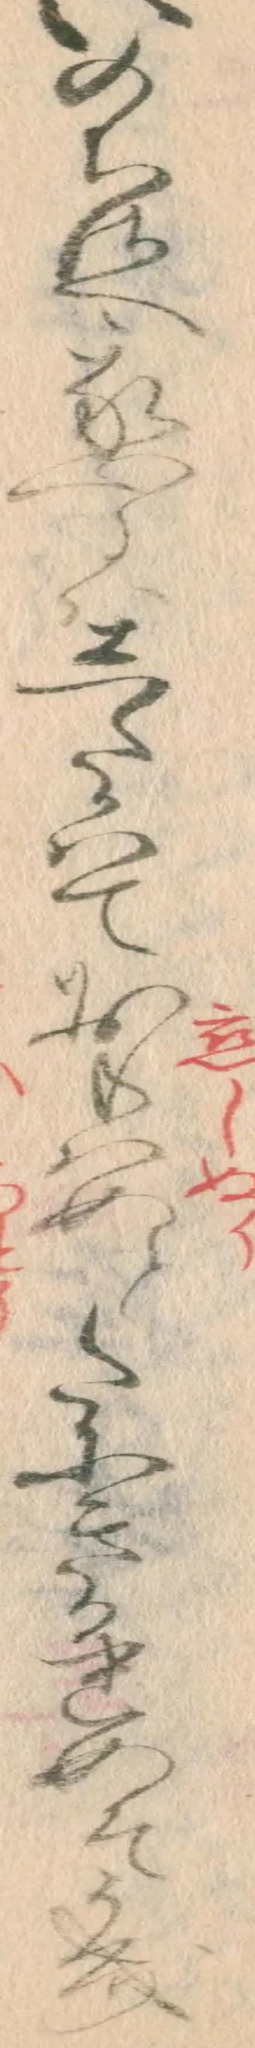いのちさへ我心にはしたかはておもはぬとたにきかれぬそうき
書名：月詣和歌集
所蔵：国立国会図書館 National Diet Library, JAPAN
